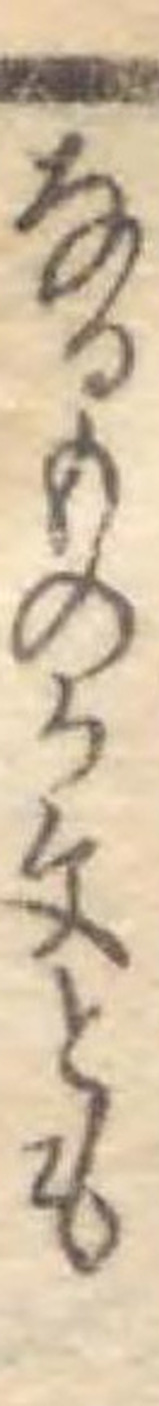なるものか文とも
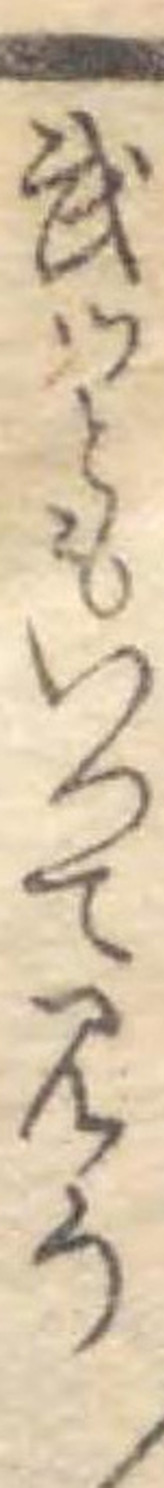武ッともいつて見ろ
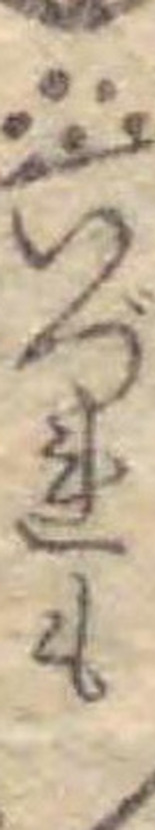いづれも
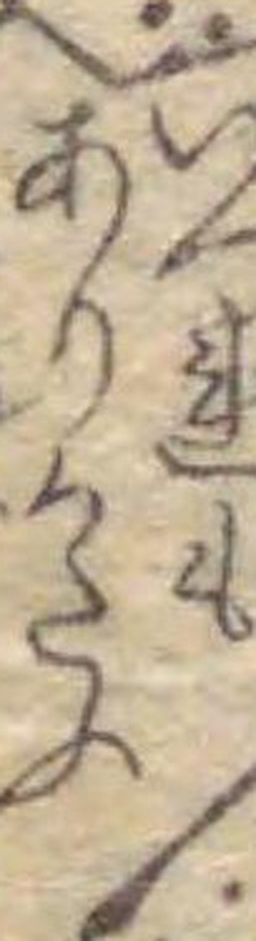ありかたふ
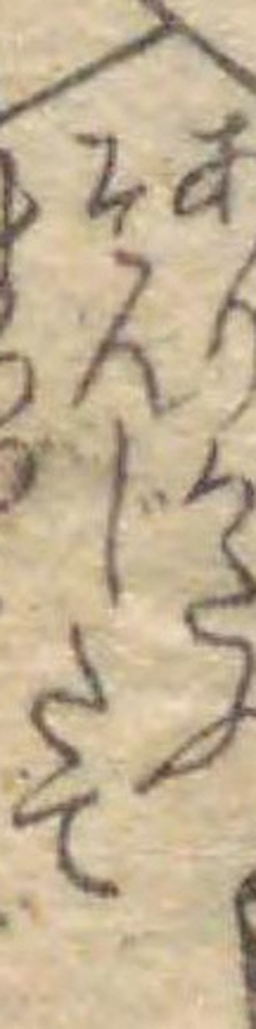そんじたて
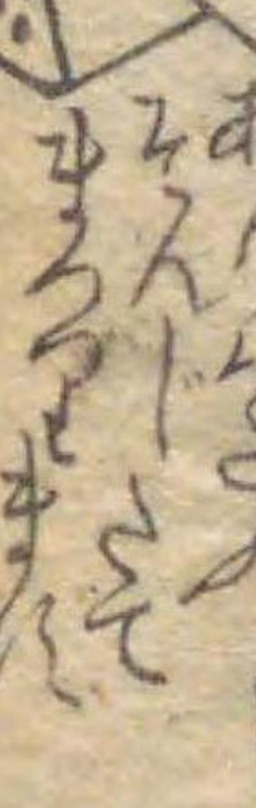まつります
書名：文武二道万石通 : 3巻
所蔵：国立国会図書館 National Diet Library, JAPAN
